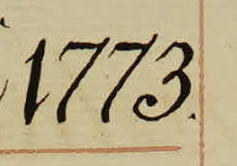1773.
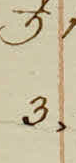3
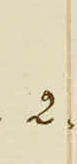2
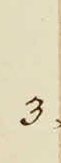3
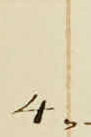4
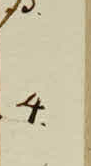4.
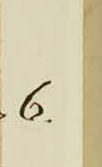6.
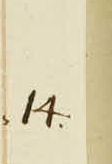14.
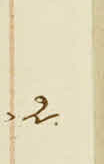2.
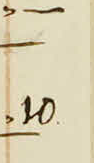10.
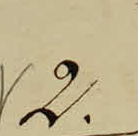2.
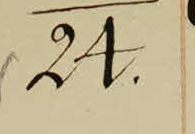24.
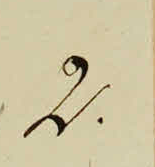2.
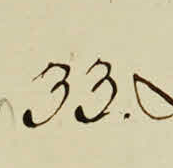33.
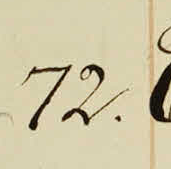72.
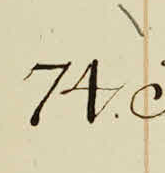74.
